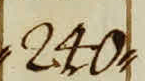240
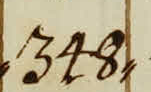348
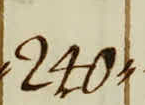240
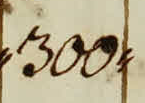300
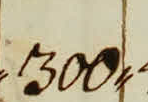300
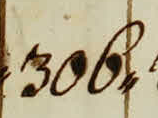306
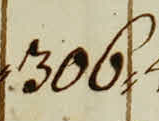306
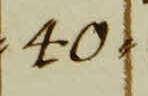40
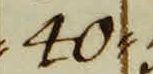40
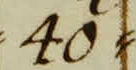40
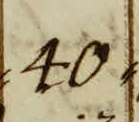40
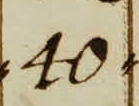40
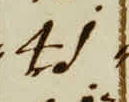41
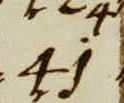41
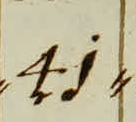41
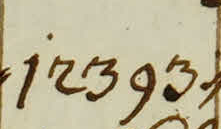12393
